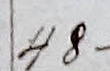48
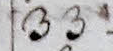33
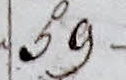59
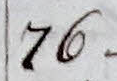76
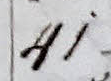41
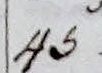45
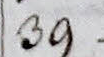39
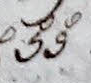55
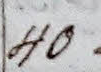40
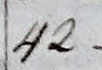42
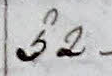52
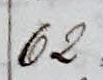62
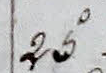25
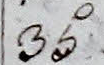35
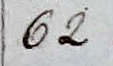62
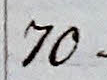70
